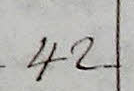42
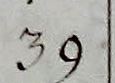39
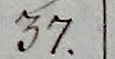37.
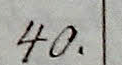40.
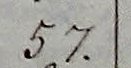57.
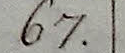67.
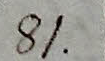81.
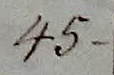45
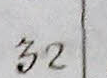32
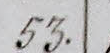53.
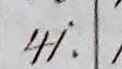41.
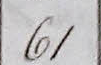61
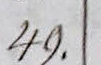49.
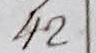42
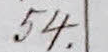54.
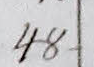48
